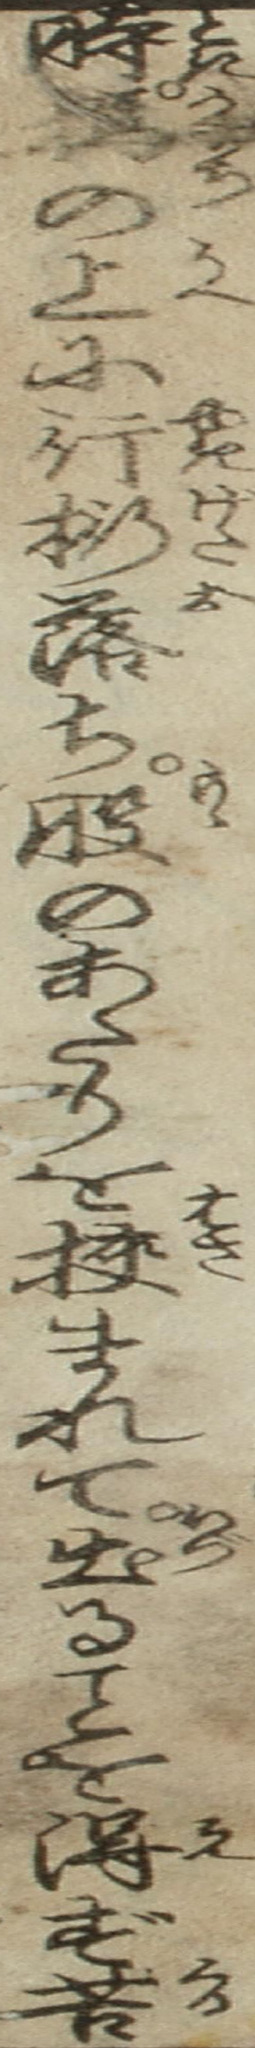時。框の上に行桁落ち。股のあたりを挟まれて。出ることを得ず苦
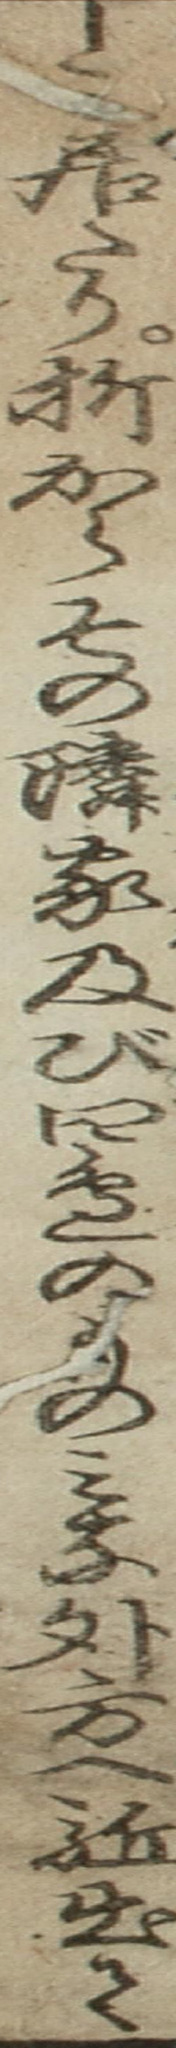しみ居たり。折からその隣家及び四辺のものみな外方へ。駈出て
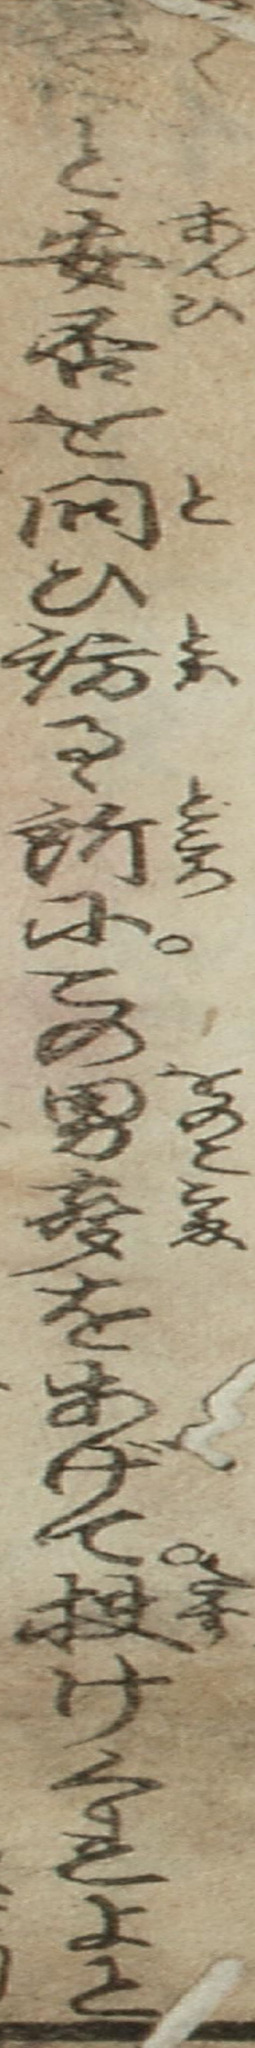囂々と安否を問ひ訪るゝ所に。この男声をあげて援けくれよと
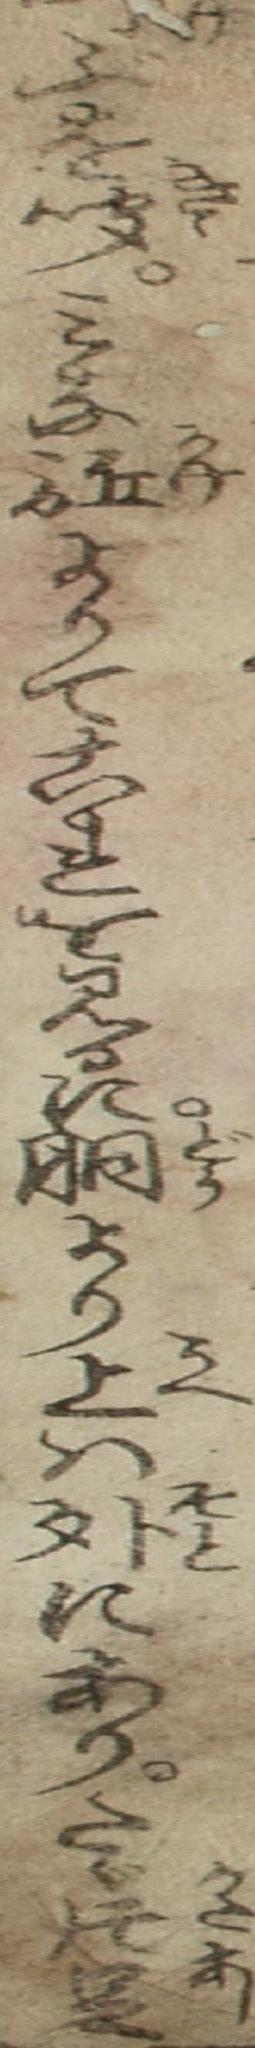叫ぶを聞。みな駈よりてこれを見るに。胴より上は外にあり。たゞ片足

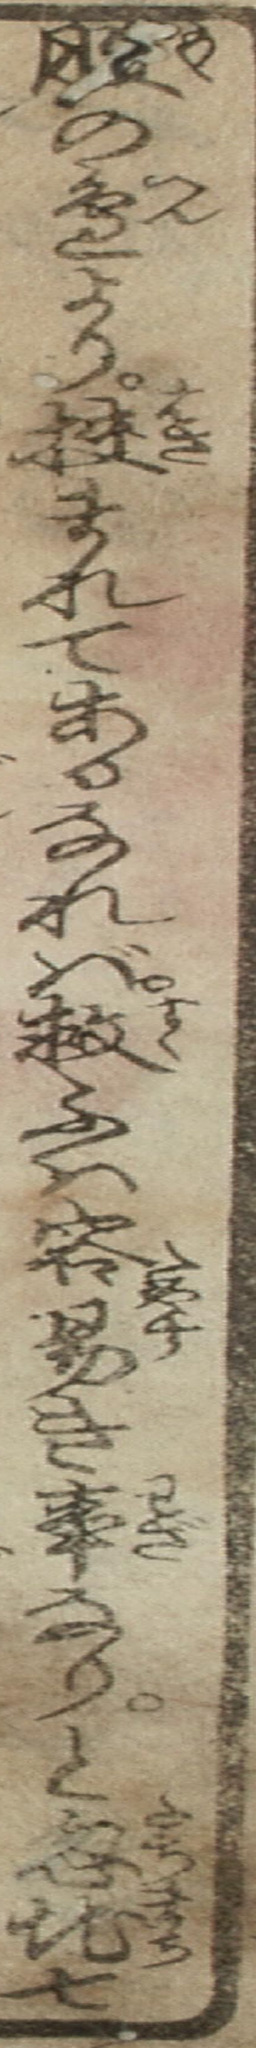股の辺より。挟まれてあるなれば。救ふは容易き事なり。と忽地七
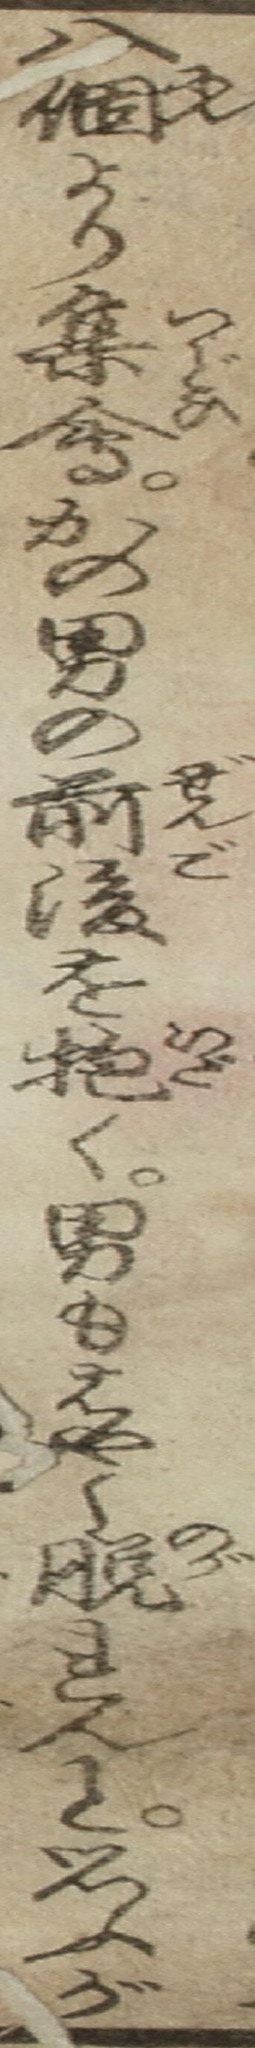八個より集会。かの男の前後を抱く。男もはやく脱れんと。思ふが
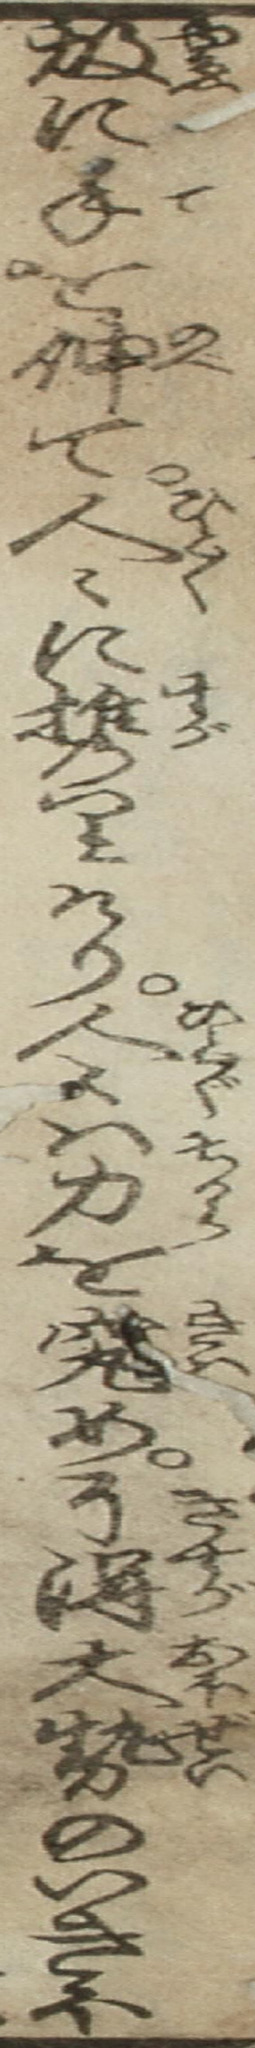故に手を伸て。人々に携りけり。人々は力を究め。了得大勢のいきほ
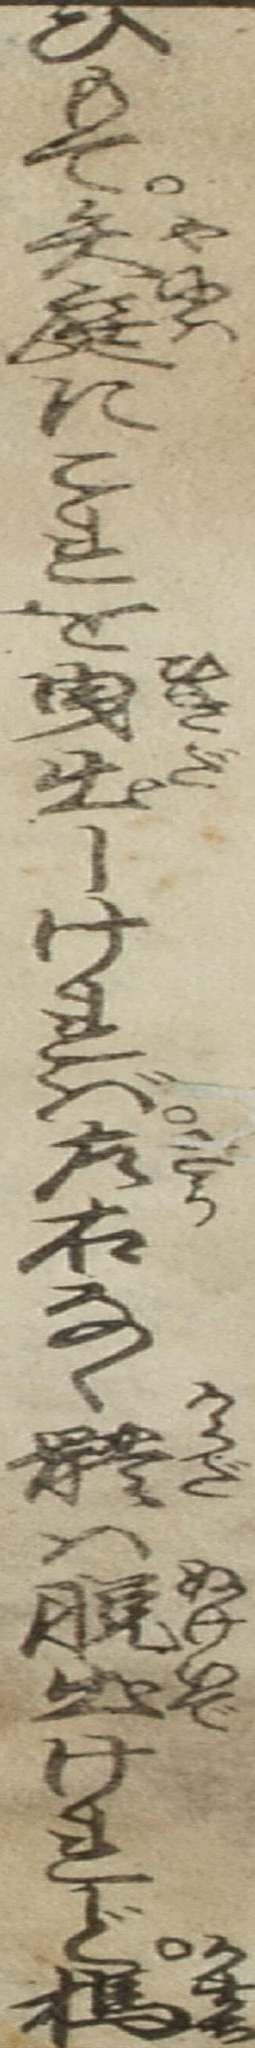ひもて。矢庭にこれを曳出しければ。左右なく體は抜出けれど。框
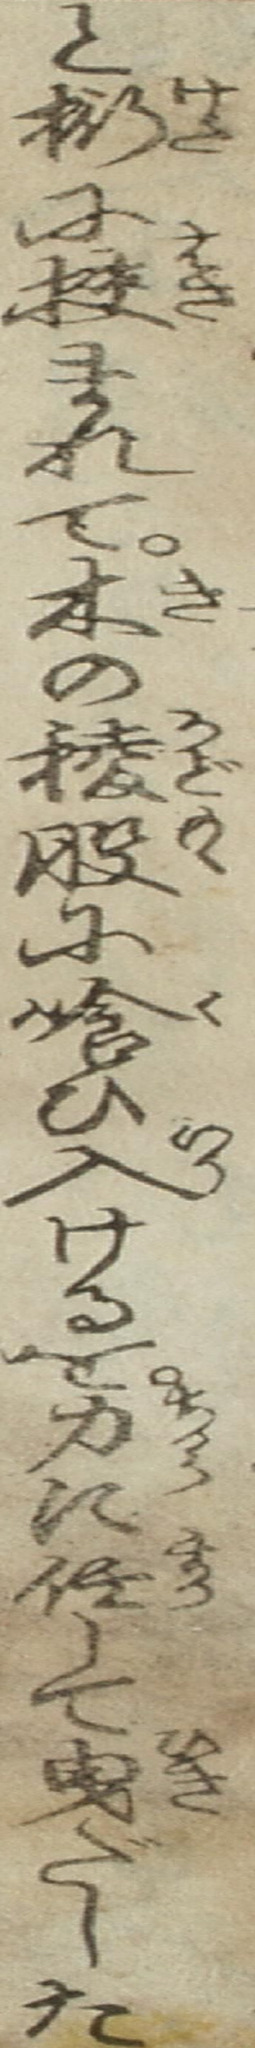と桁に挟まれて。木の稜股に喰ひ入けるを。力に任して曳だした
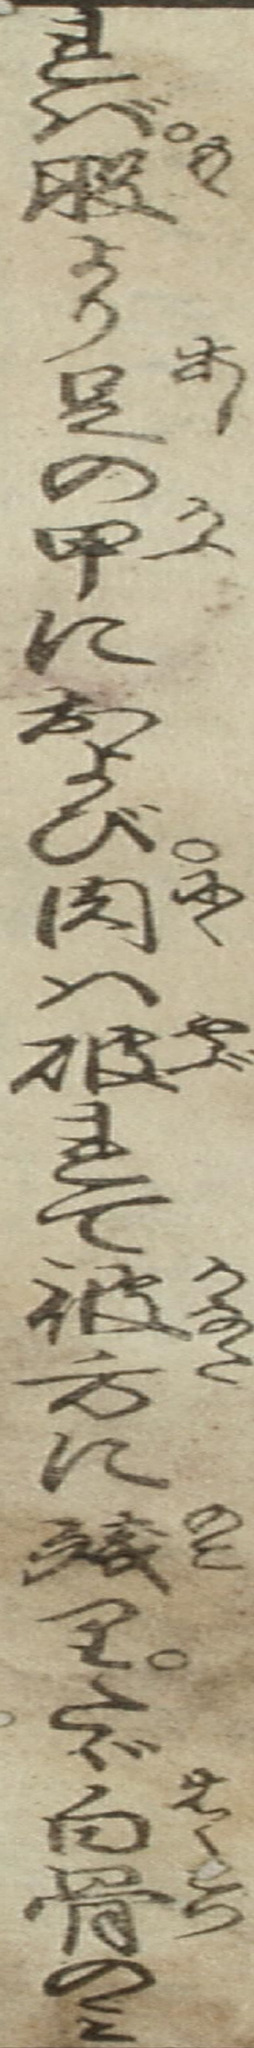れば。股より足の甲におよび。肉は破れて彼方に残り。たゞ白骨のみ
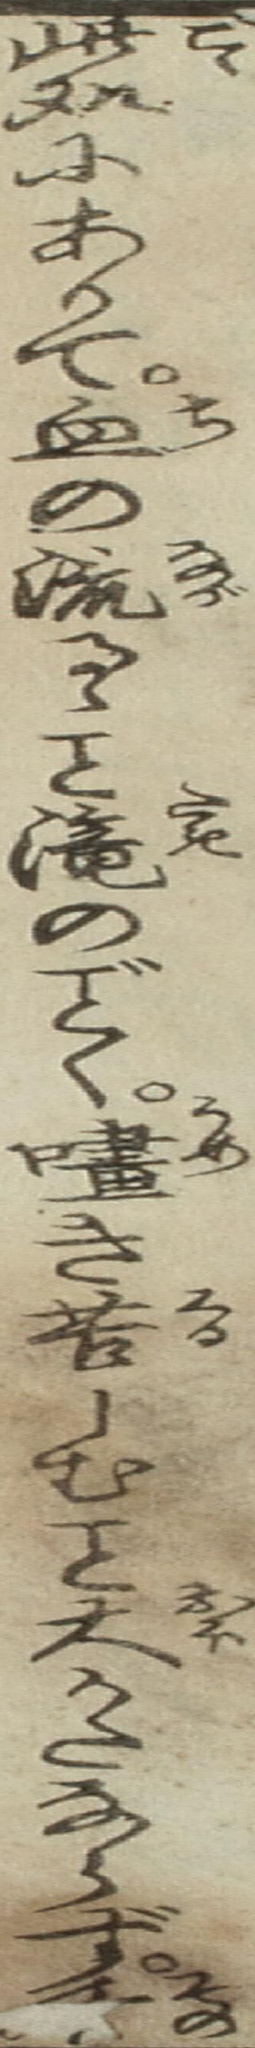此処にありて。血の流るゝこと滝のごとく。呻き苦しむこと大かたならず。其
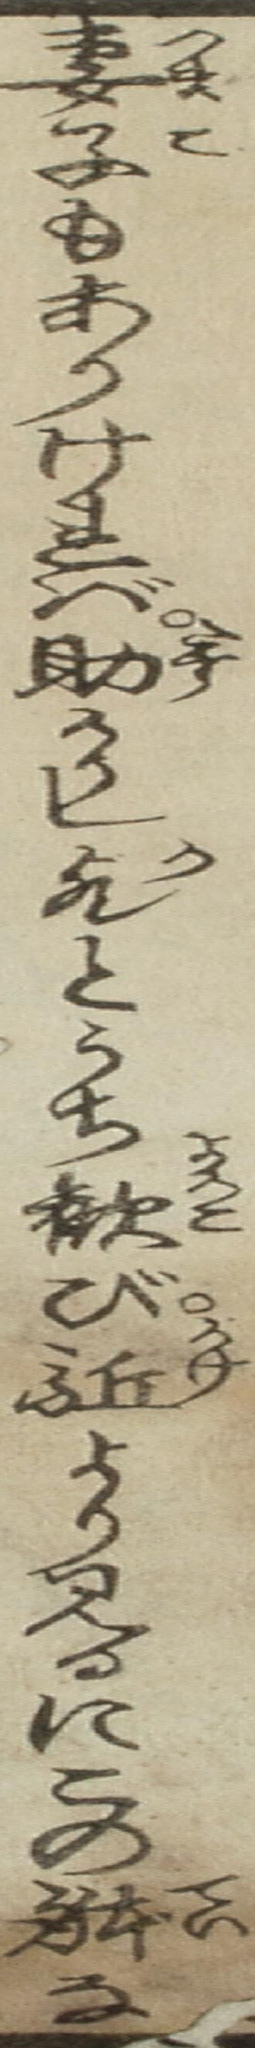妻子もありければ。助かりし歟かとうち歓び。駈より見るにこの体な
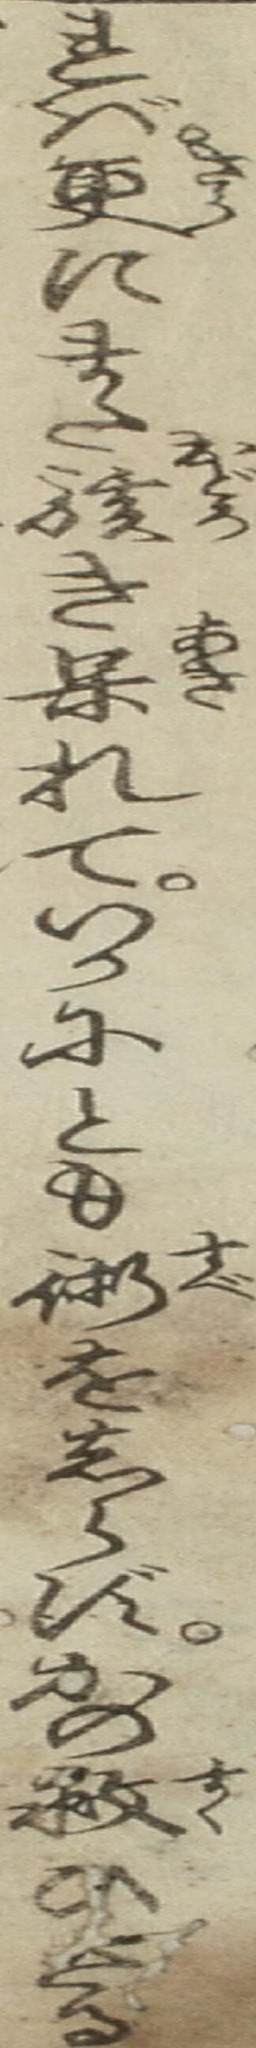れば更にまた駭き呆れて。いかにとも術をしらず。かの救ひたる
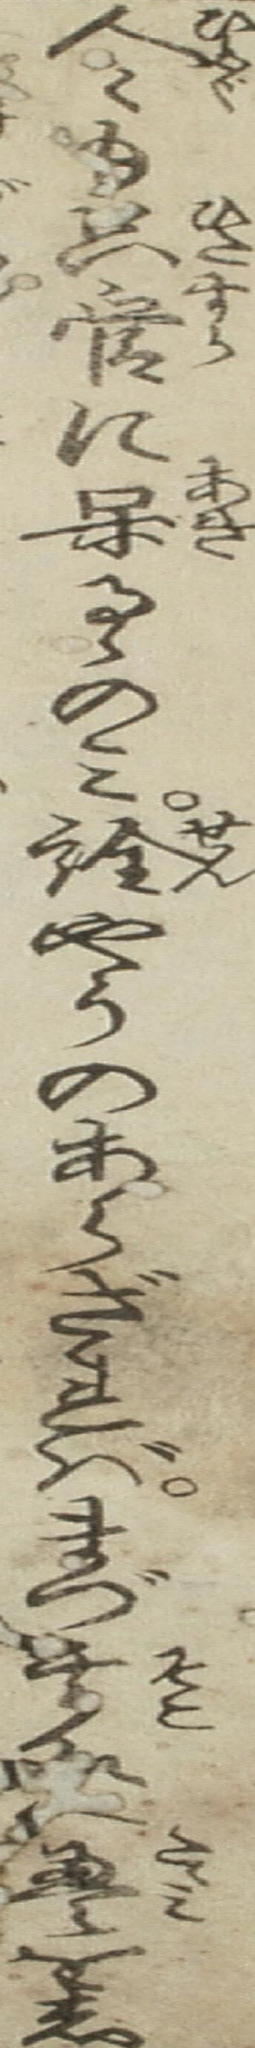人々も只管に呆るゝのみ。詮やうのあらざれば。まづ其処へ畳をし
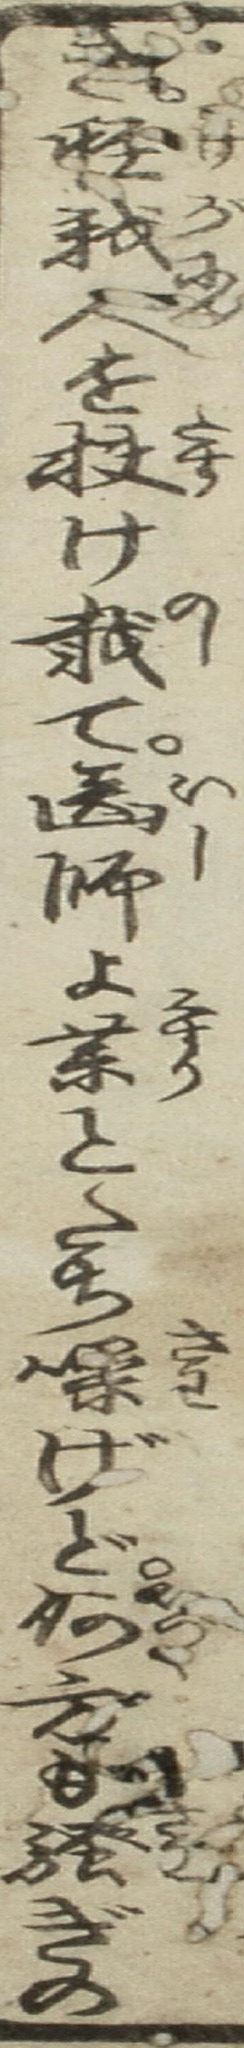き怪我人を救け載て。医師よ薬とたち噪げど。何方も騒ぎの
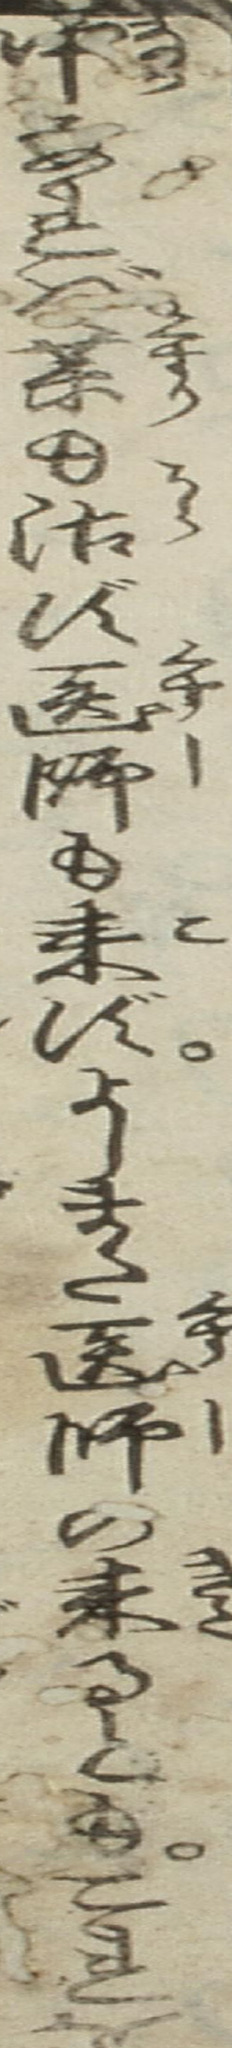中なれば薬も沽ず医師も来ず。よしまた医師の来るとも。これを
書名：安政見聞録　中
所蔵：東京大学地震研究所図書室 Earthquake Research Institute Library, The University of Tokyo, JAPAN
